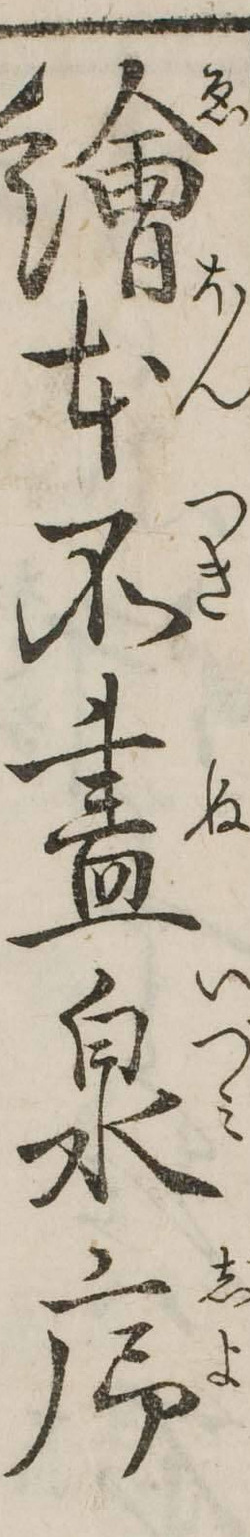絵本不尽泉序
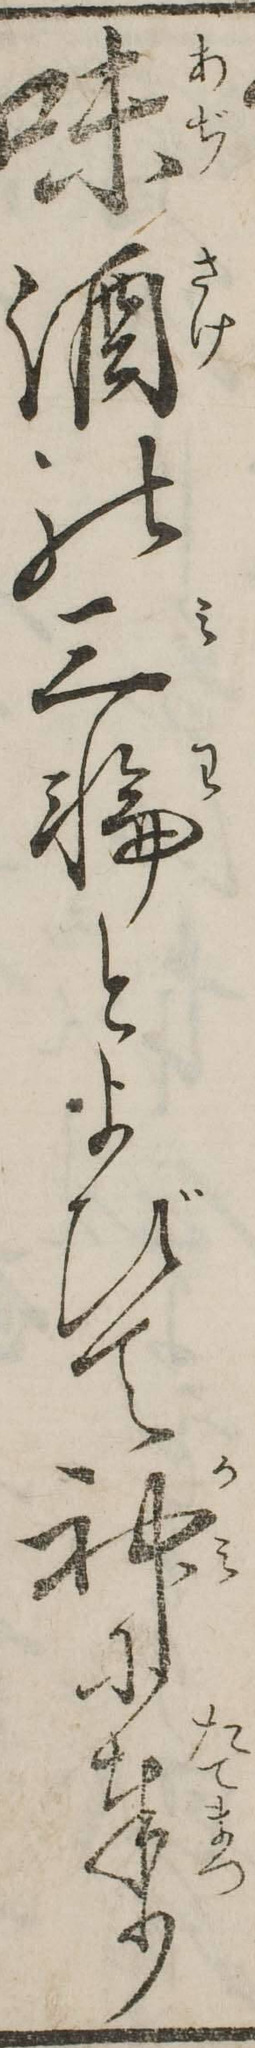味酒の三輪とよびて神に奉り
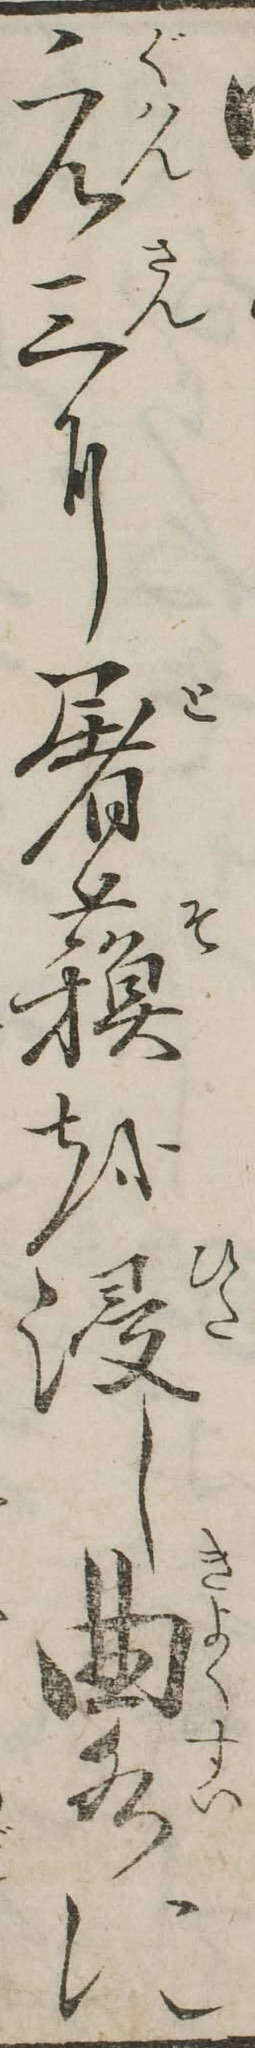元三に屠蘇を浸し曲水に
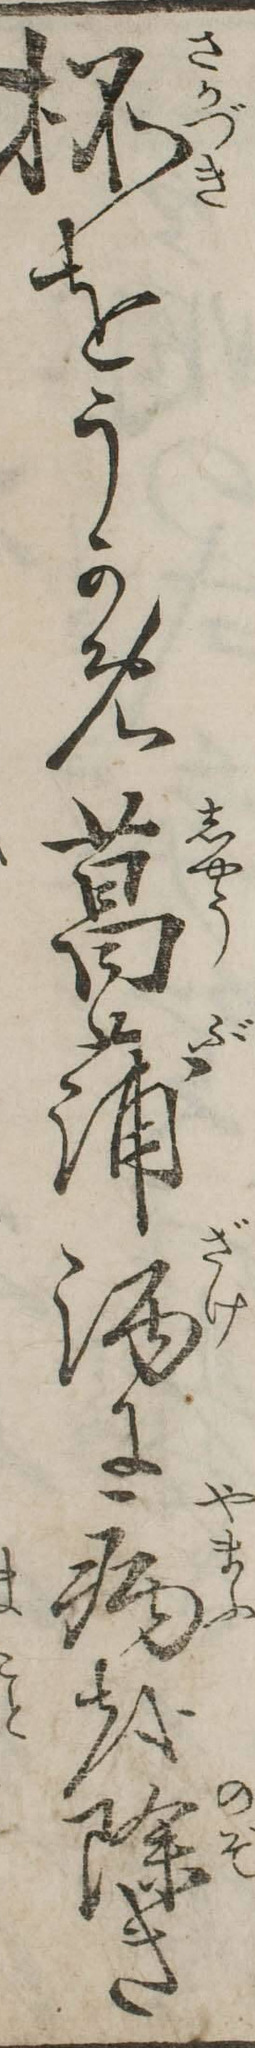杯をうかめ菖蒲酒に病を除き
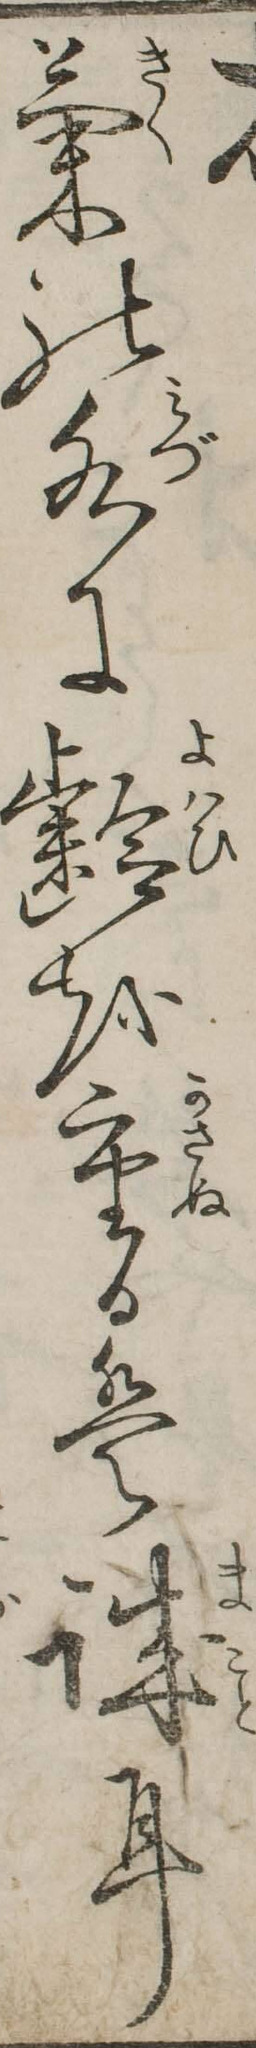菊の水に齢を重るは誠に
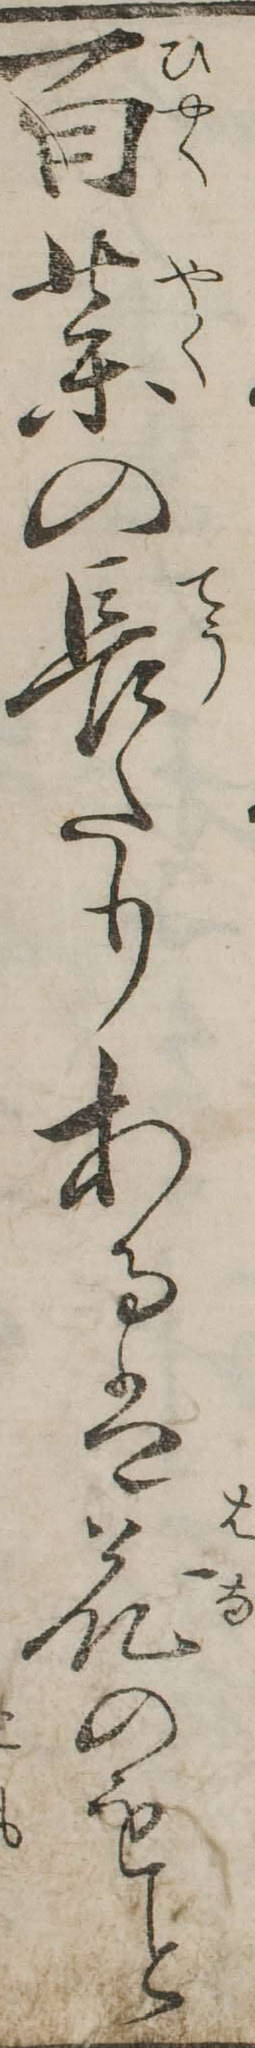百薬の長たりあるは花のもと
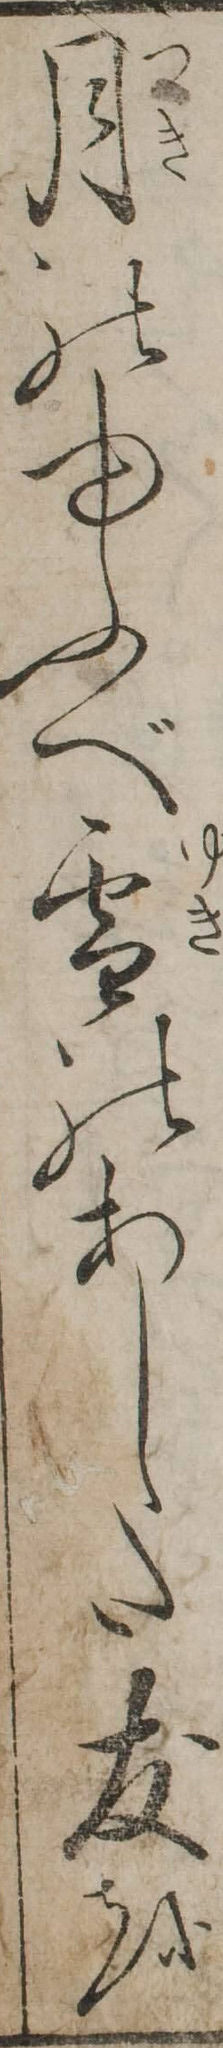月のゆふべ雪のあした友を

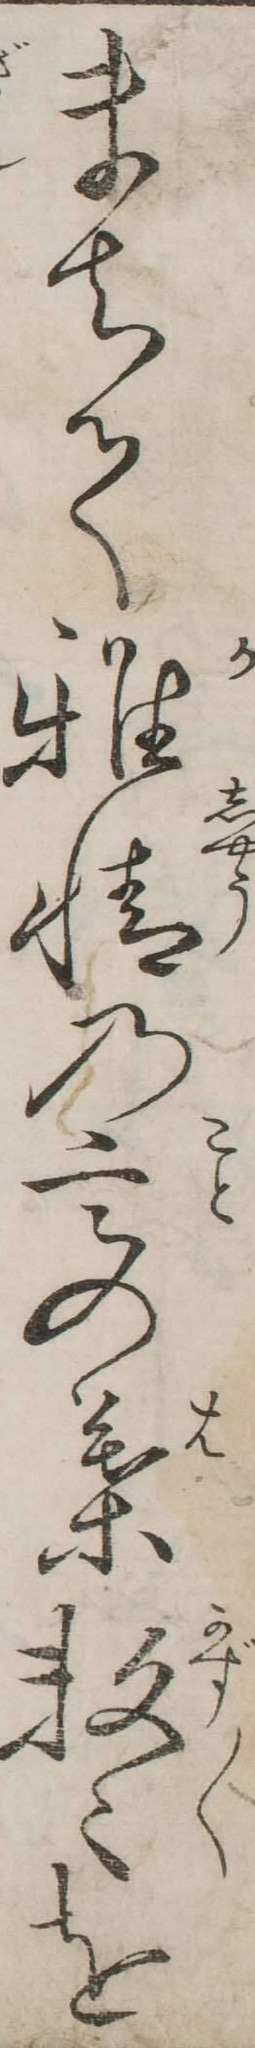まちて雅情の言の葉数々を
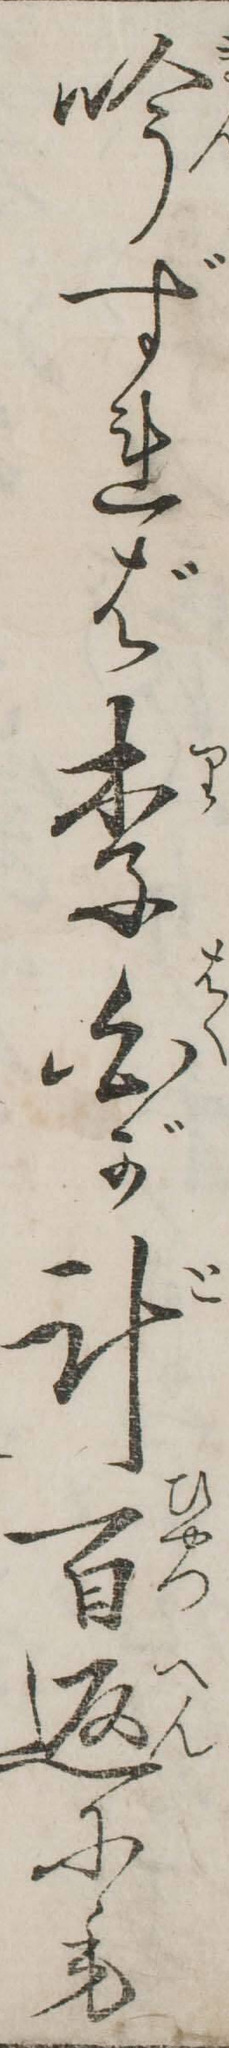吟ずれば李白が斗百返にも
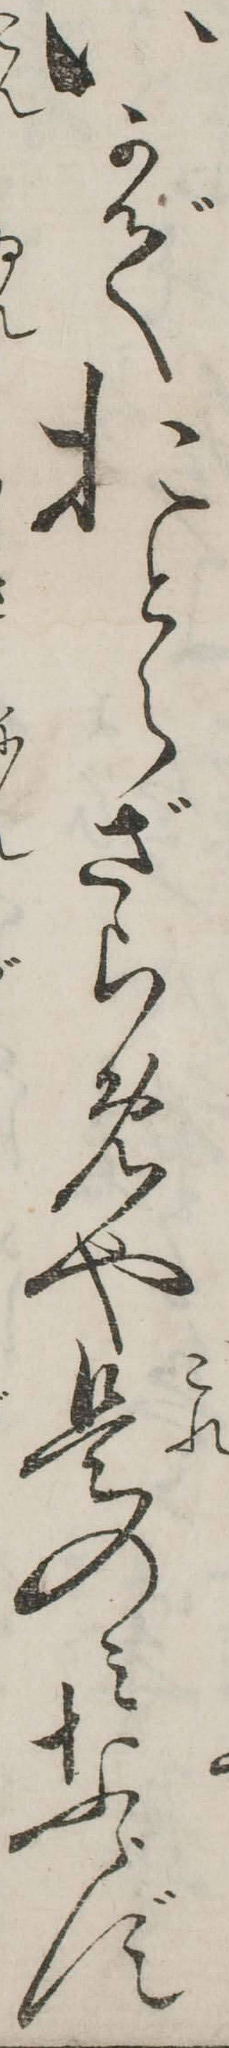いかでおとらざめや是のみならず
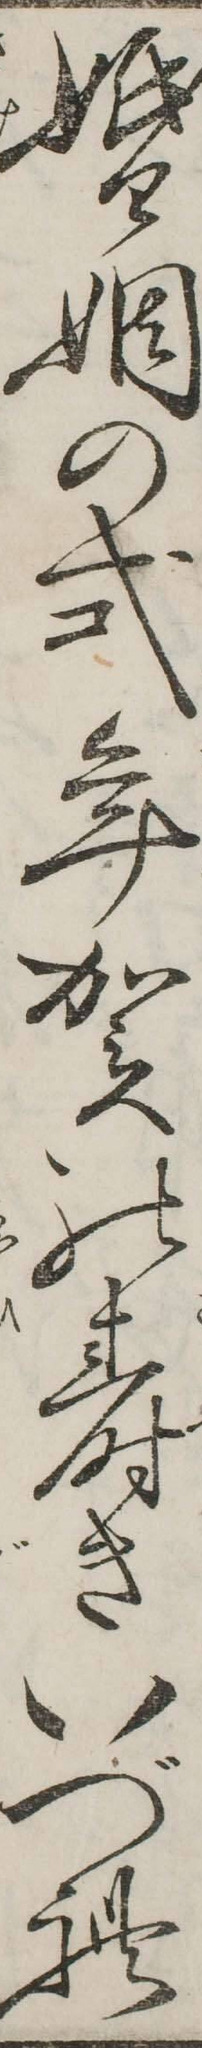婚姻の式年賀の寿きいづれ
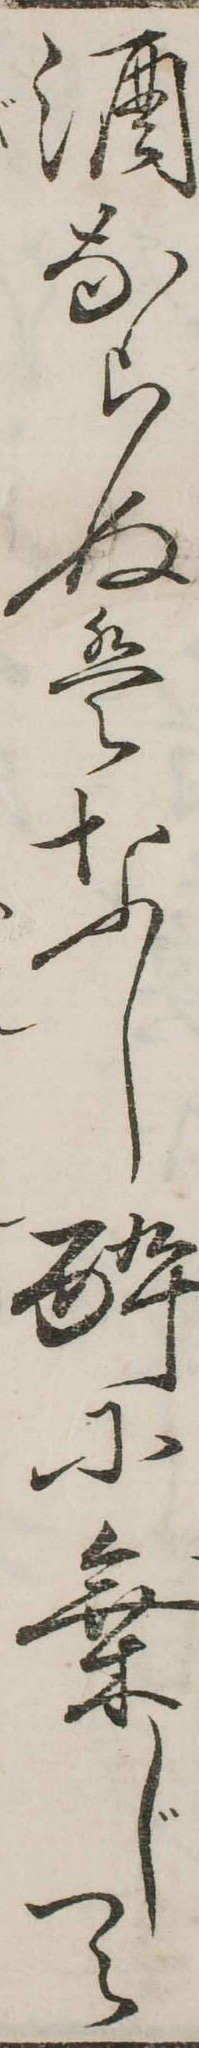酒ならぬはなし酔に乗じて
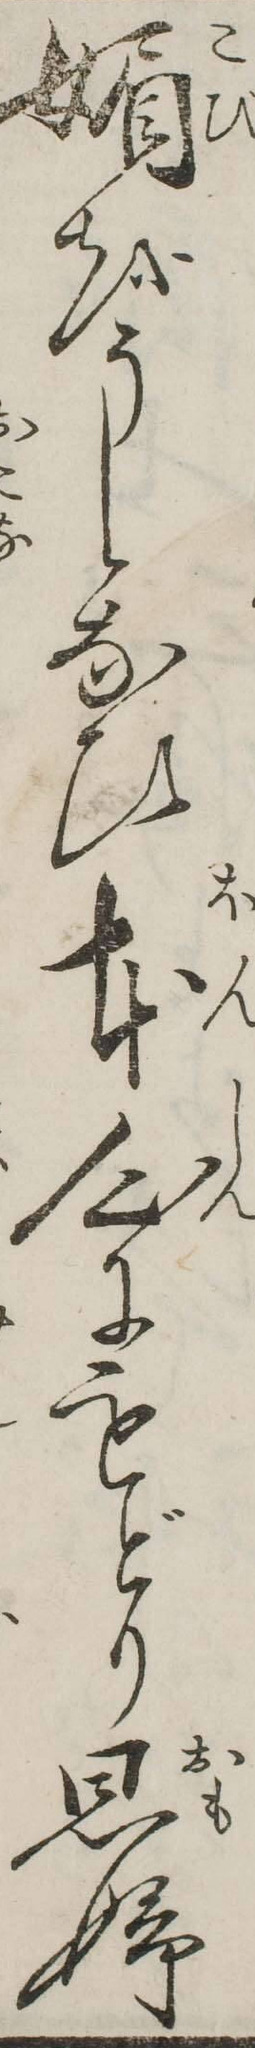媚をうしなひ本心にもどり思ふ
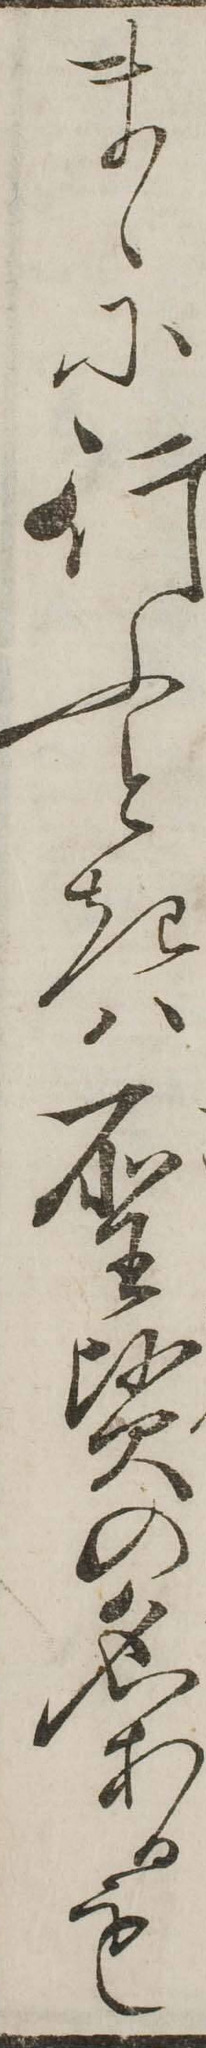まゝに行ふときは聖賢の名あるも
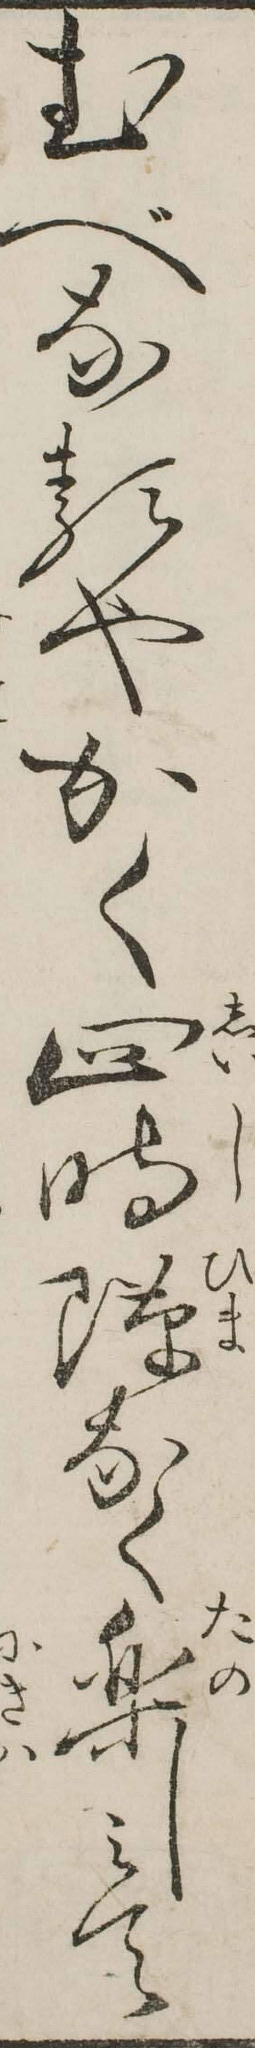むべなるやかく四時隙なく楽しみて
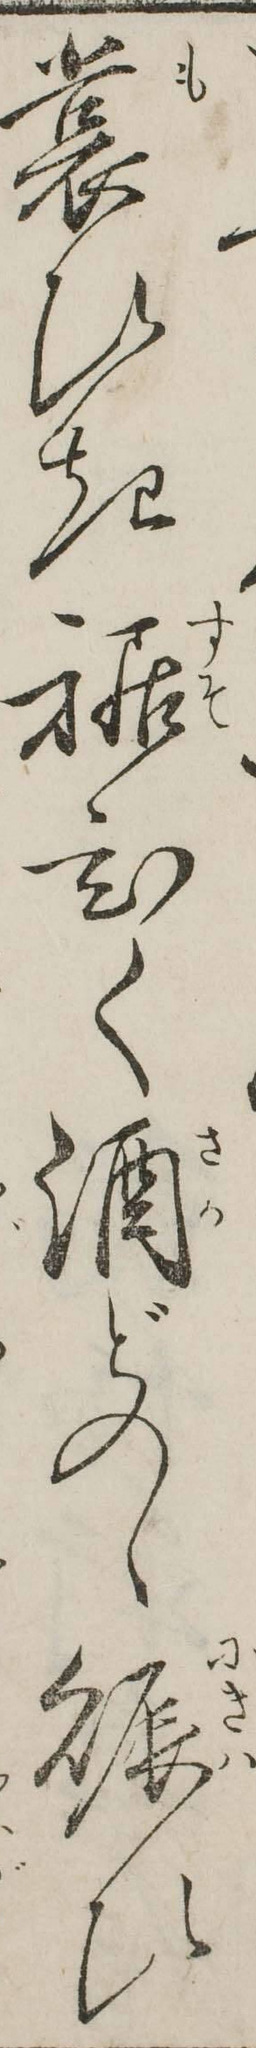裳ひき裾ひく酒どのゝ賑ひ
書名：繪本不盡泉
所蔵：国文学研究資料館
